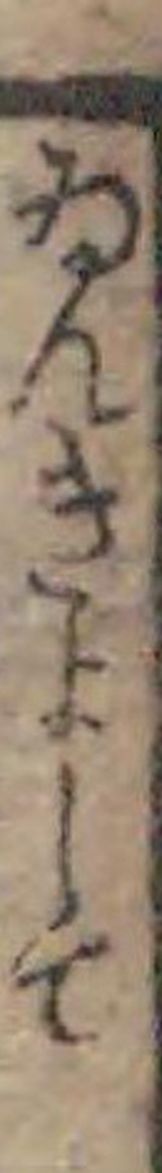ゐんきよして
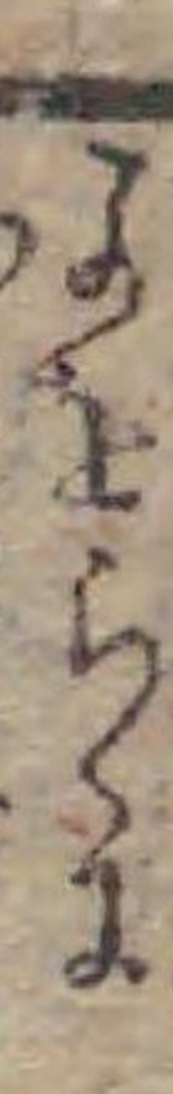よをらくに
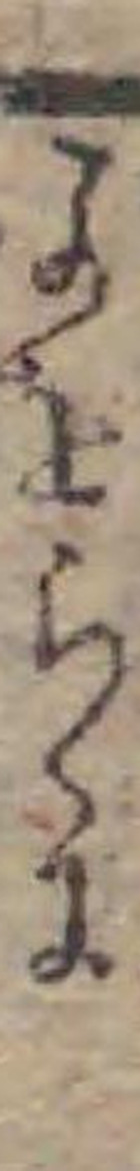よをらくに
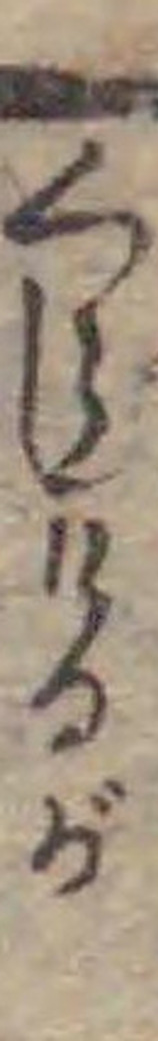くらしけるが
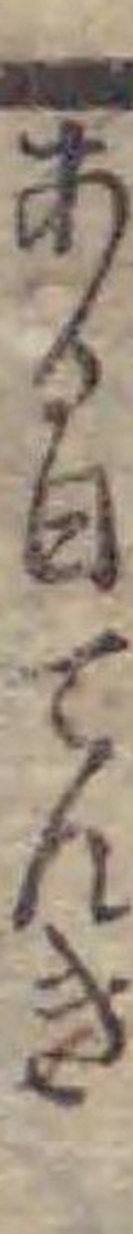ある日てんき
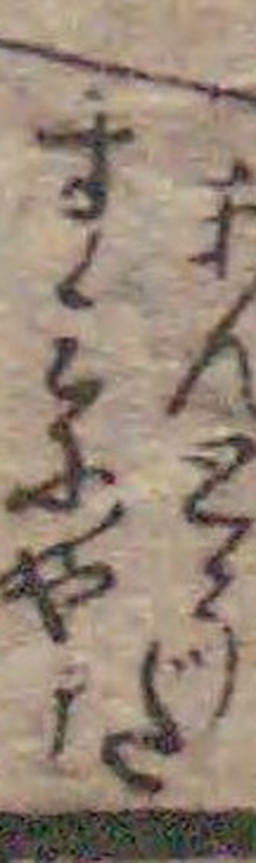すみにやァ
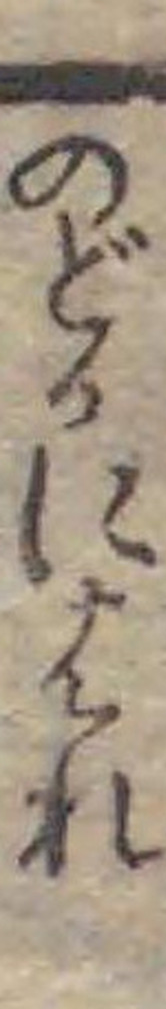のどかにはれ
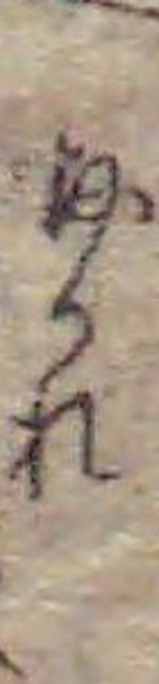おかれ
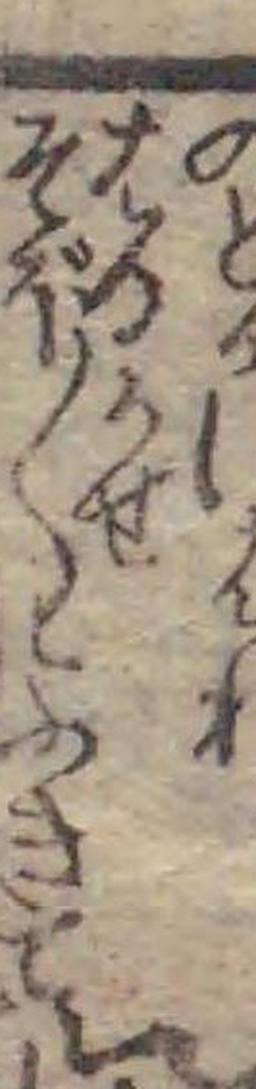そぼ〳〵とふきて
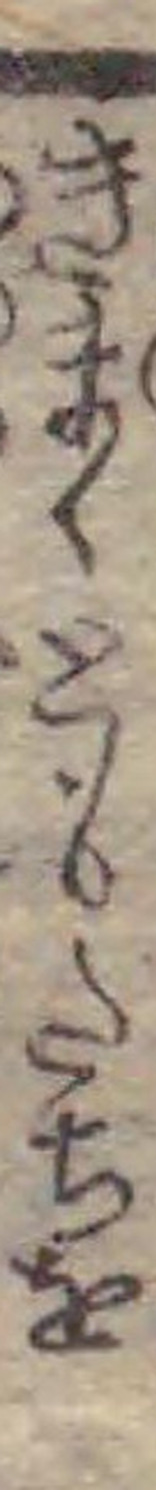きまゝともたちを
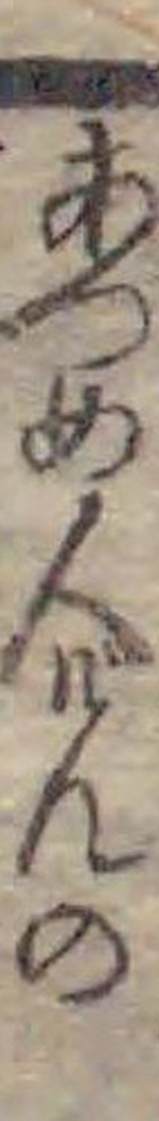あつめ人げんの
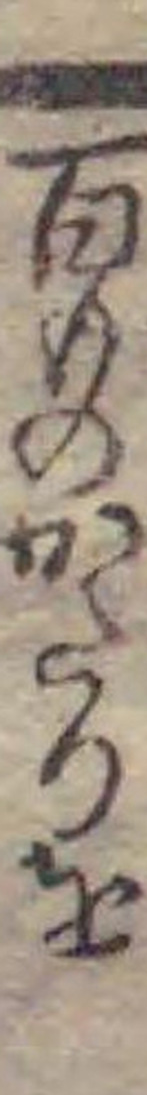百ものかたりを
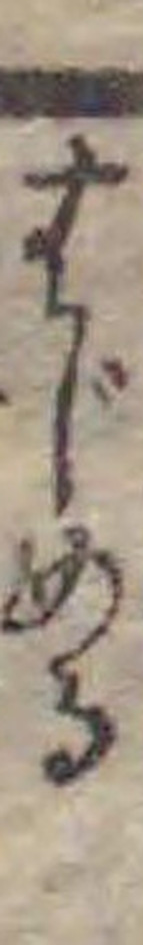はじめる
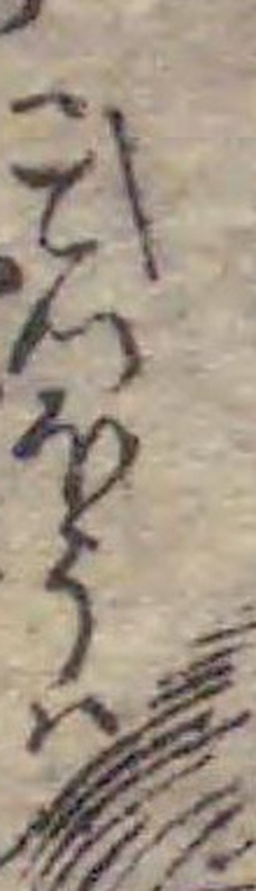〽てつほうは
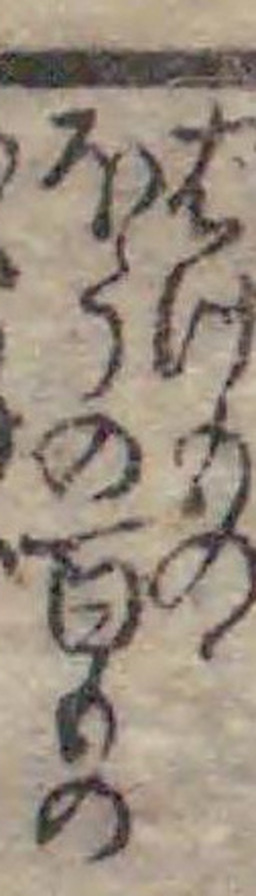ほうの百もの
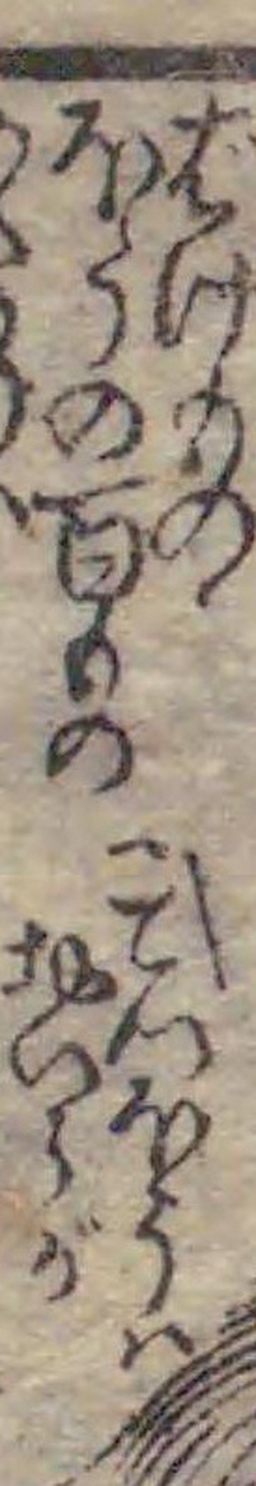ほうの百もの
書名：怪物つれつれ草 : 2巻
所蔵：国立国会図書館 National Diet Library, JAPAN
